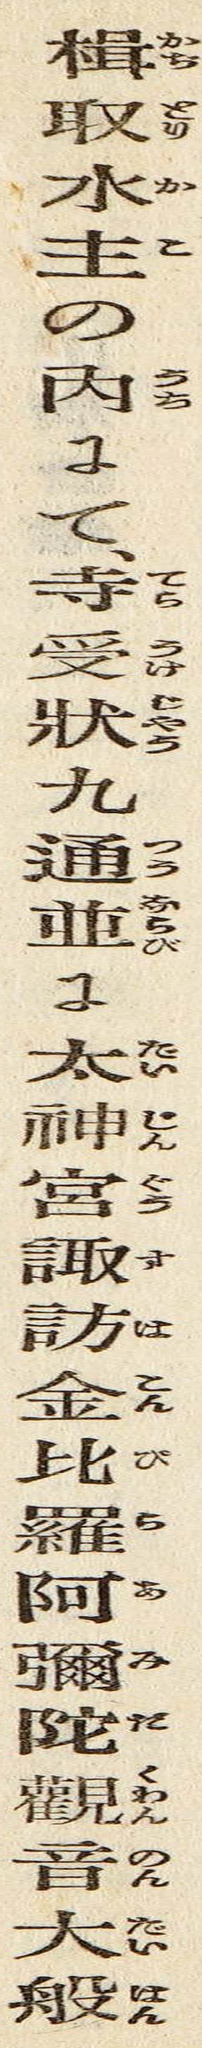楫取水主の内にて、寺受状九通並に太神宮諏訪金毘羅阿弥陀観音大般
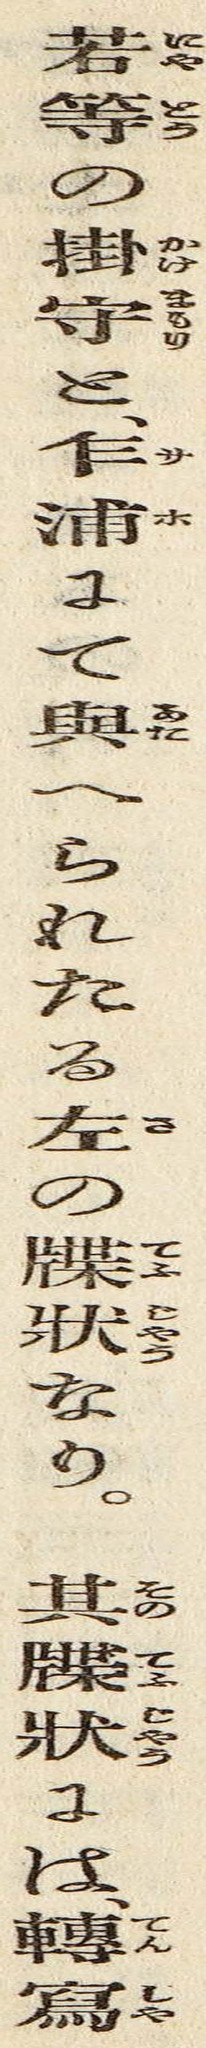若等の掛守と、乍浦にて与えられたる左の牒状なり。その牒状には、転写
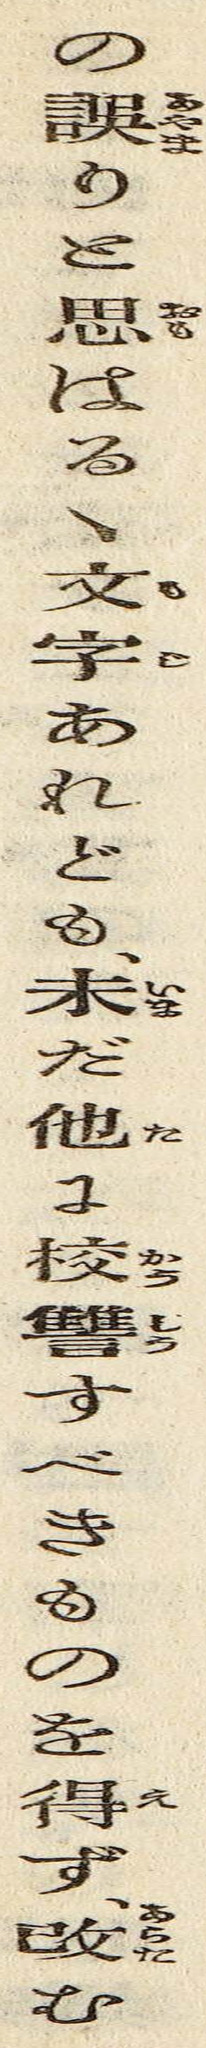の誤りと思はるゝ文字あれども、未だ他に校讐すべきものを得ず、改む

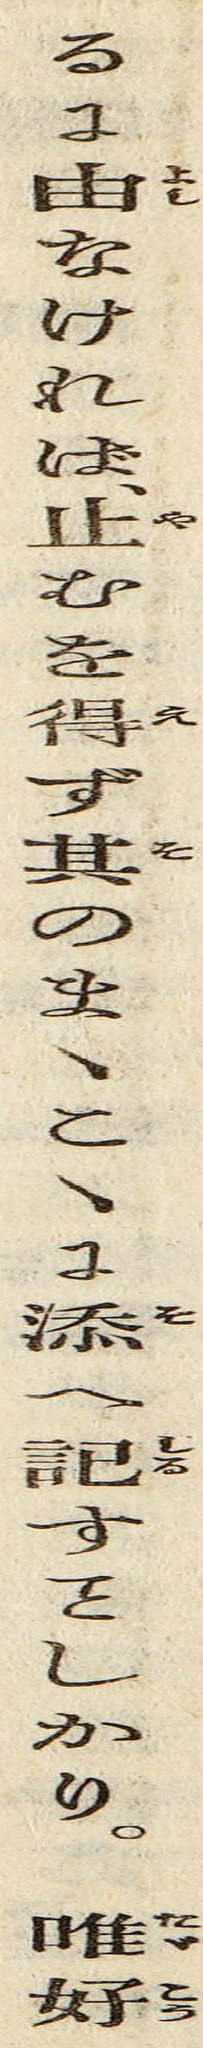るに由なければ、止むを得ず其のまゝに添へ記すことしかり。唯好
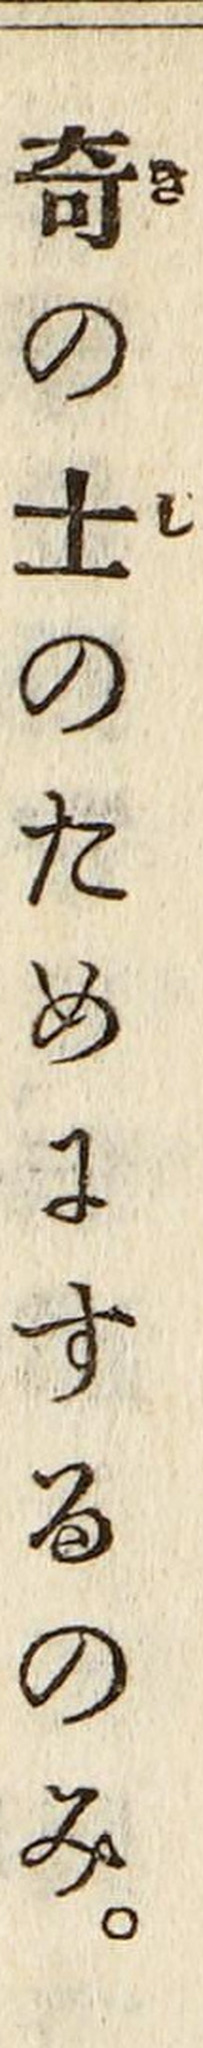奇の士のためにするのみ。
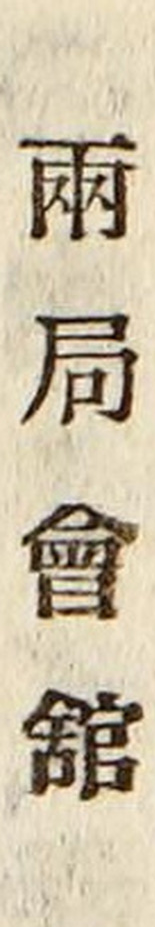両局会館
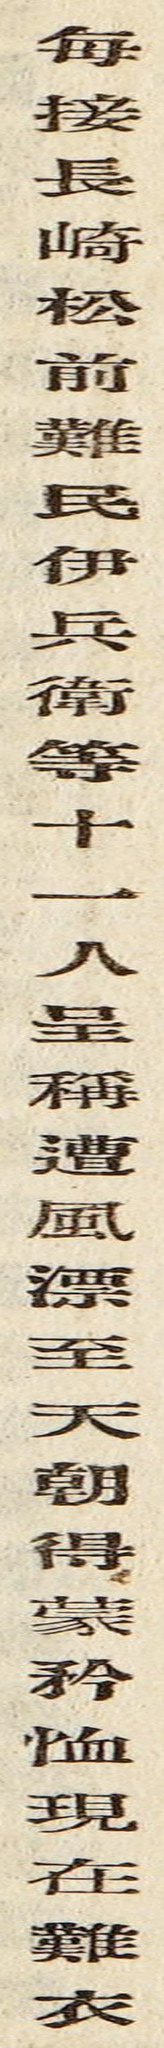毎接長崎松前難民伊兵衛等十一人呈称遭風漂至天朝得蒙矜恤現在難衣
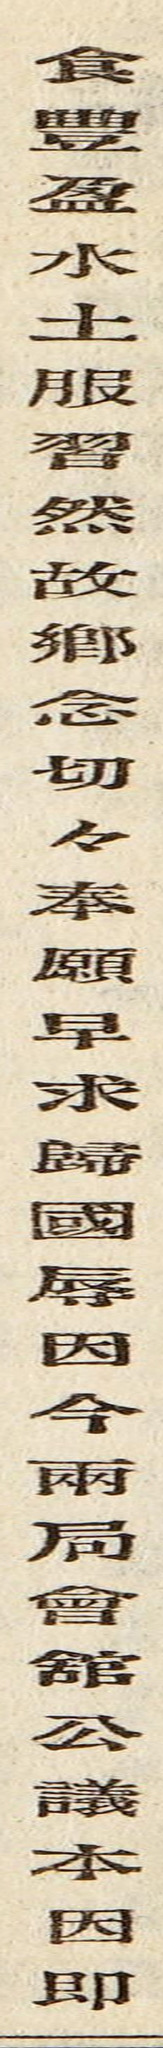食豊盈水土服習然故郷念切々奉願早求帰国辱因今両局会館公議本因即
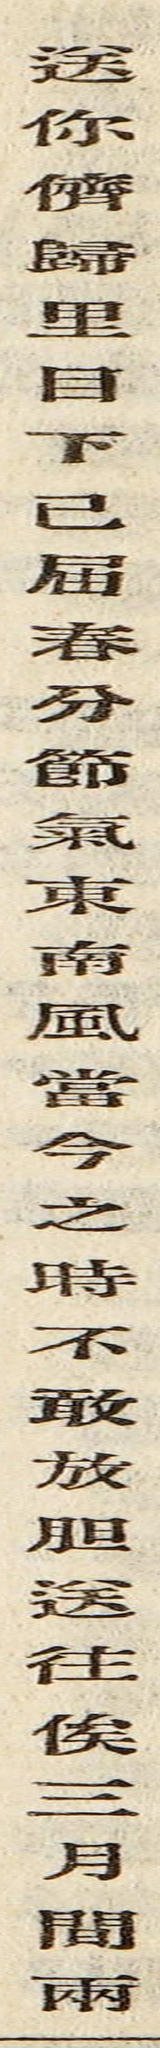送称儕帰里目下已届春分節気東南風当今之時不敢放胆送往俟三月間両
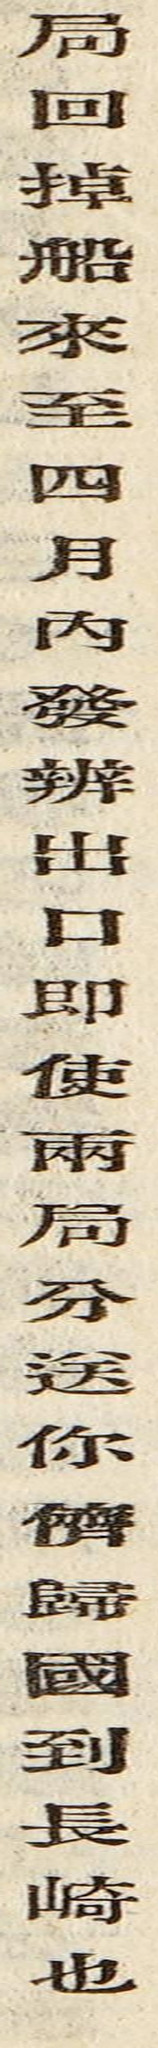局回掉船来至四月内発弁出口即使両局分送称儕帰国到長崎也
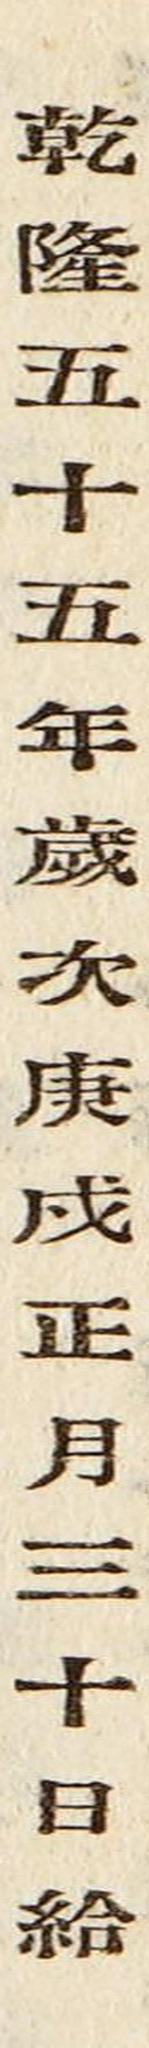乾隆五十五年歳次庚戌正月三十日給
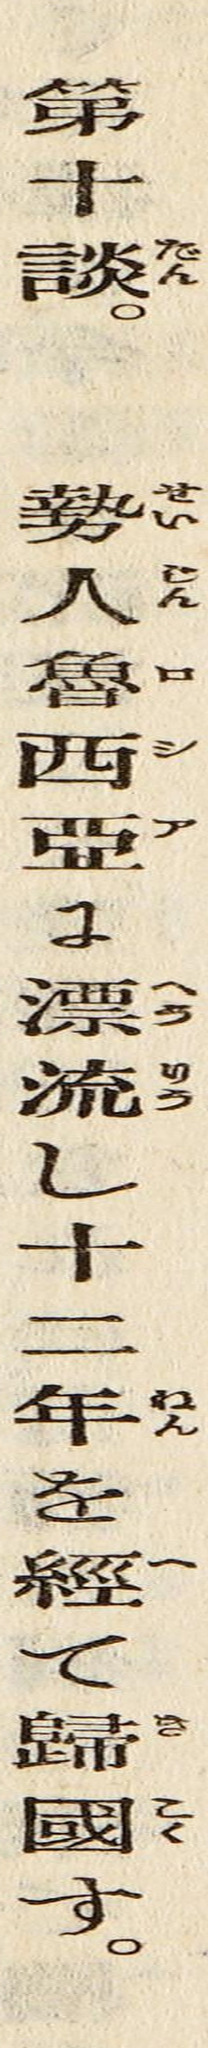第十談。勢人魯西亜に漂流し十二年を経て帰国す。
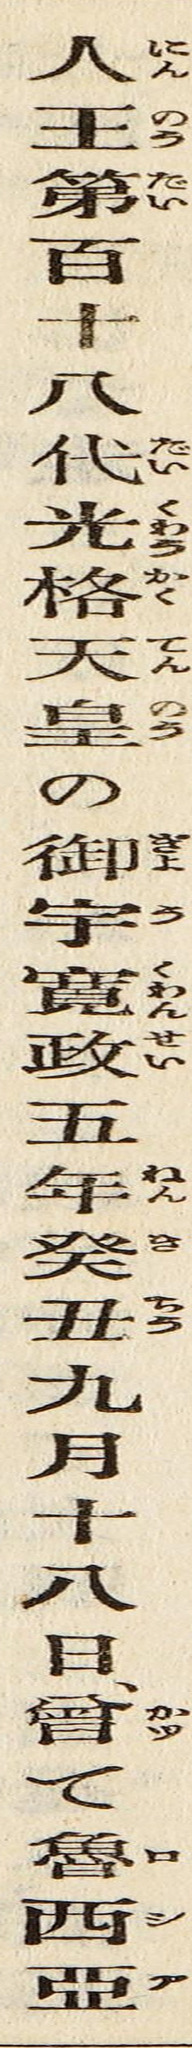人王第百十八代光格天皇の御宇寛政五年癸丑九月十八
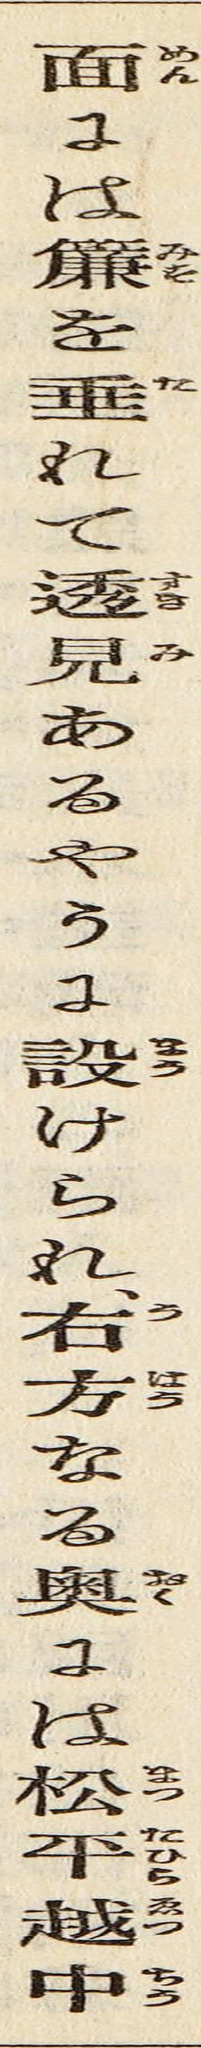面には簾を垂れて透見あるやうに設けられ、右方なる奥には松平越中
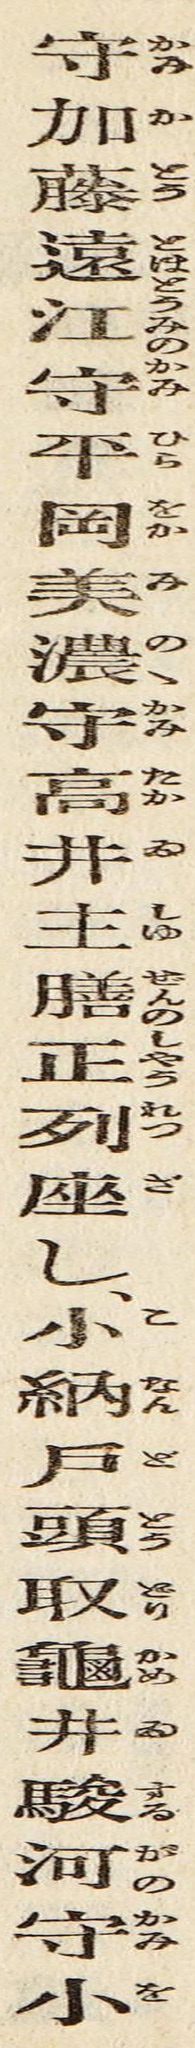守加藤遠江守平岡美濃守高井主膳正列座し、小納戸頭取亀井駿河守小
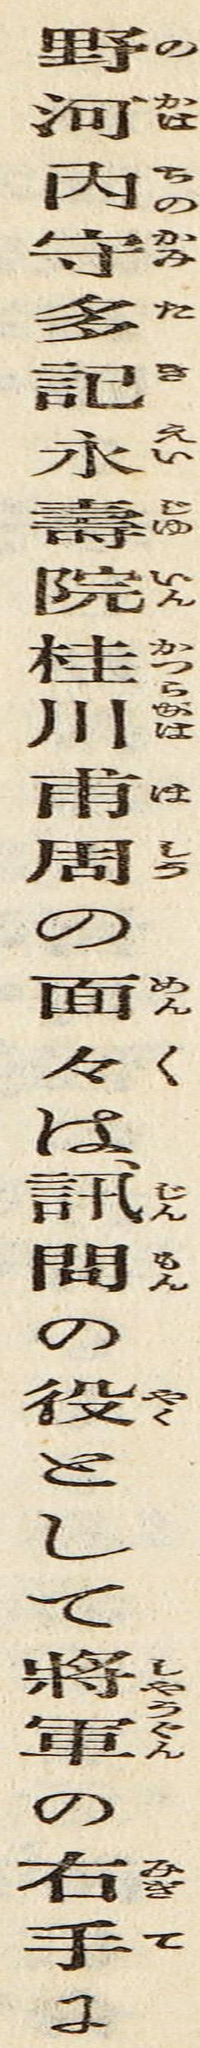野河内守多記永寿院桂川甫周の面々は訊問の役として将軍の右手に
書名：日本漂流譚
